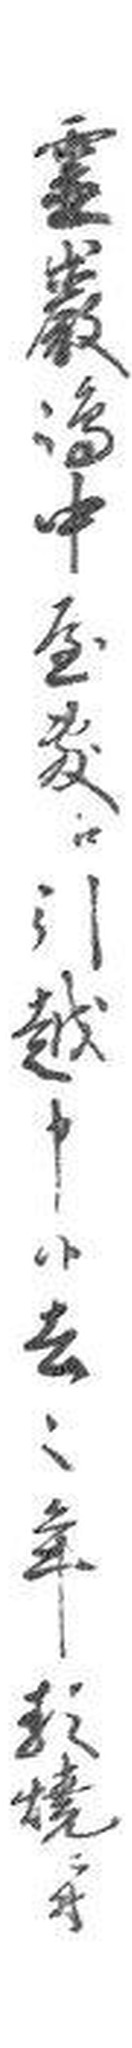霊巌島中屋敷江引越申候去々年類焼ニ付
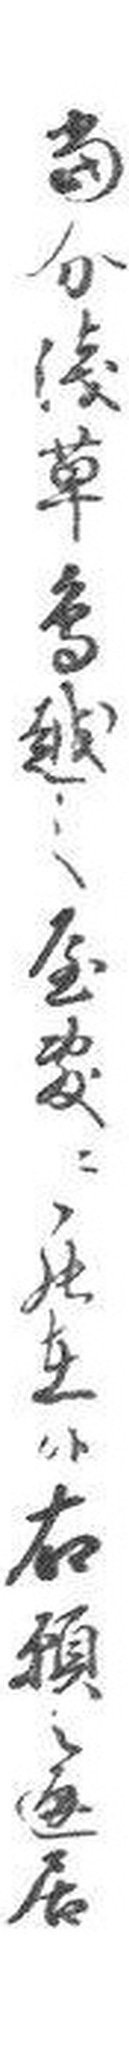当分浅草鳥越之屋敷ニ罷在候右願之通居
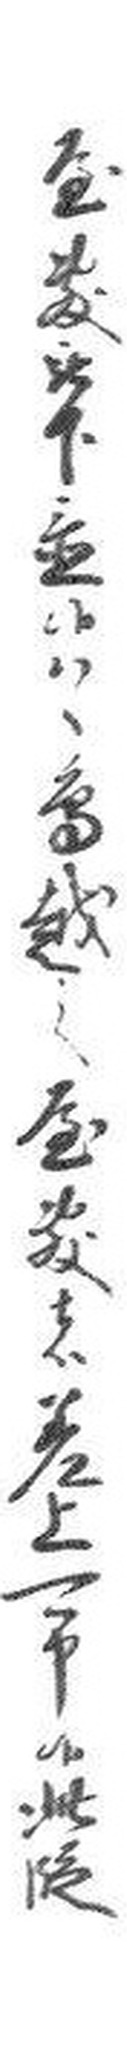屋敷被下置候ハゝ鳥越之屋敷者差上可申候此段
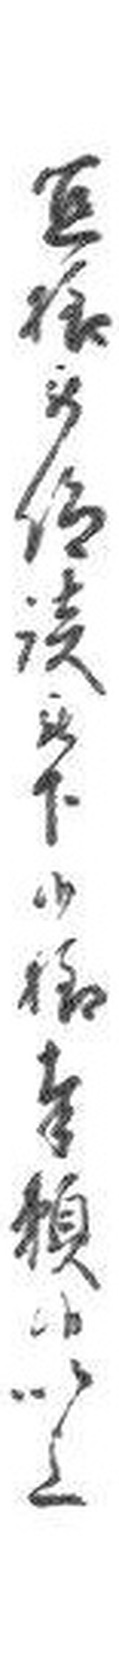宜様被仰談被下候様奉願候以上
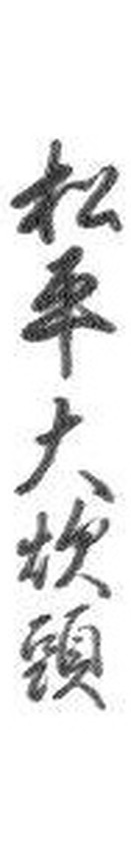松平大炊頭
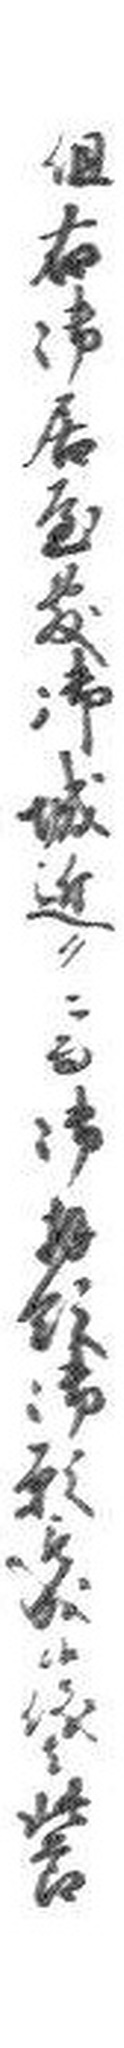但右御居屋敷御城近クニ而御拝領御願被成候儀者此節
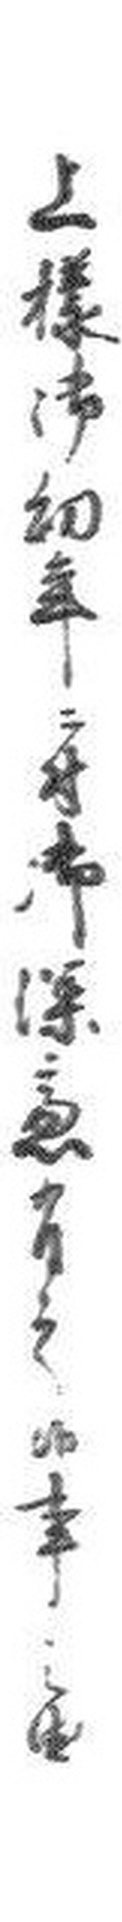上様御幼年ニ付御深慮有之候事之由
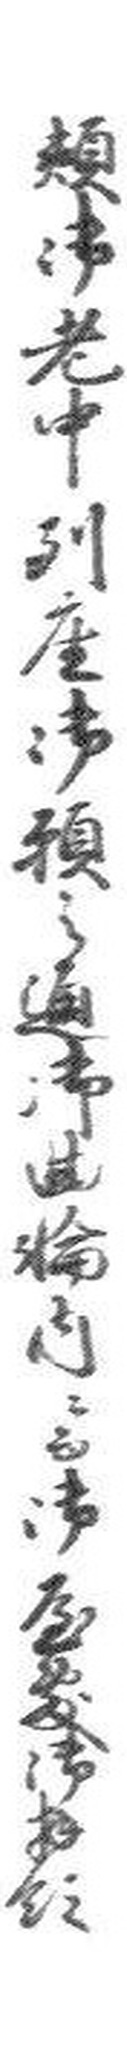頬御老中列座御願之通御曲輪内ニ而御屋敷御拝領
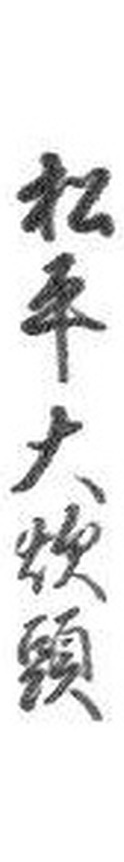松平大炊頭
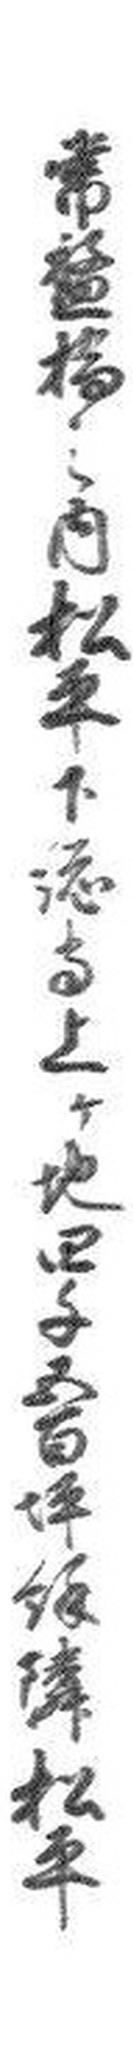常盤橋之内松平下総守上ケ地四千五百坪余隣松平
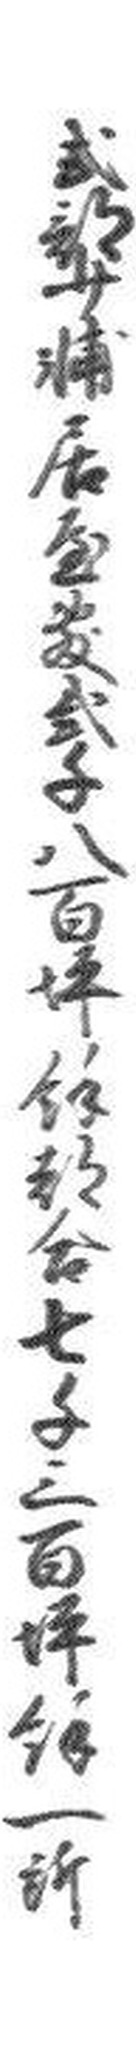式部少輔居屋敷弐千八百坪余都合七千三百坪余一所

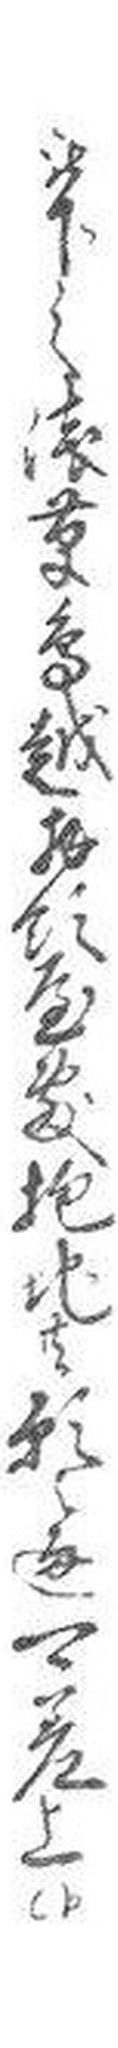被下之浅草鳥越拝領屋敷抱地共願之通可差上候
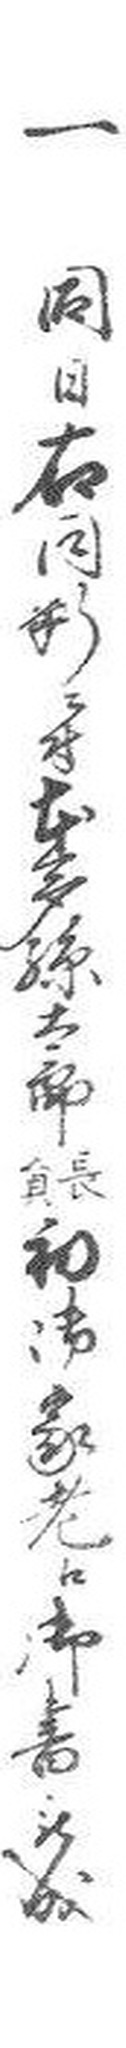一同日右同断ニ付本多孫太郎長員初御家老江御書被成
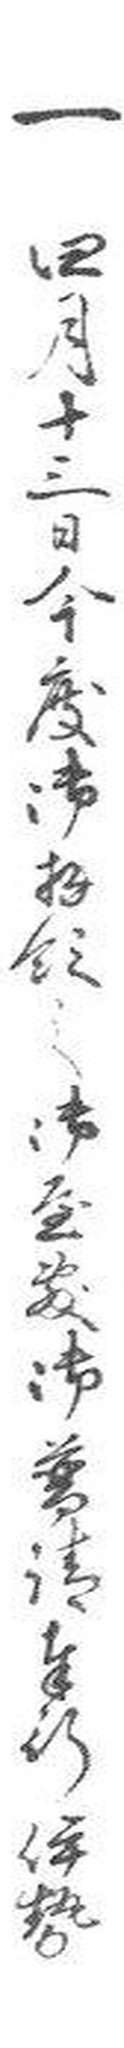一四月十三日今度御拝領之御屋敷御普請奉行伊勢
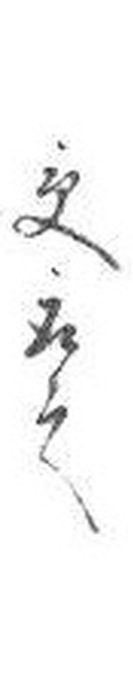受取之
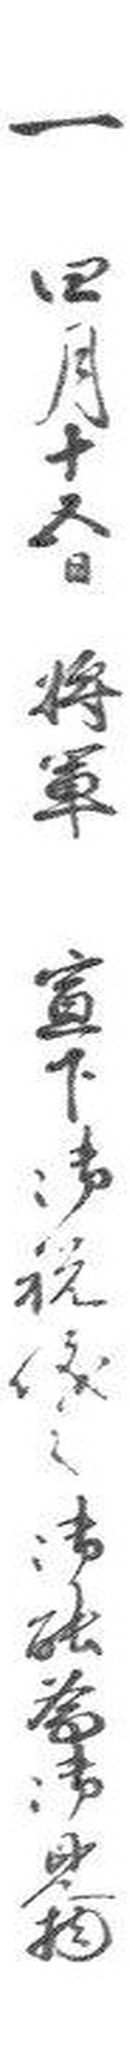一四月十五日将軍宣下御祝儀之御能為御見物
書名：家譜 二十九 吉邦公 従正徳二年到正徳三年
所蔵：福井県文書館 Fukui Prefectural Archives
